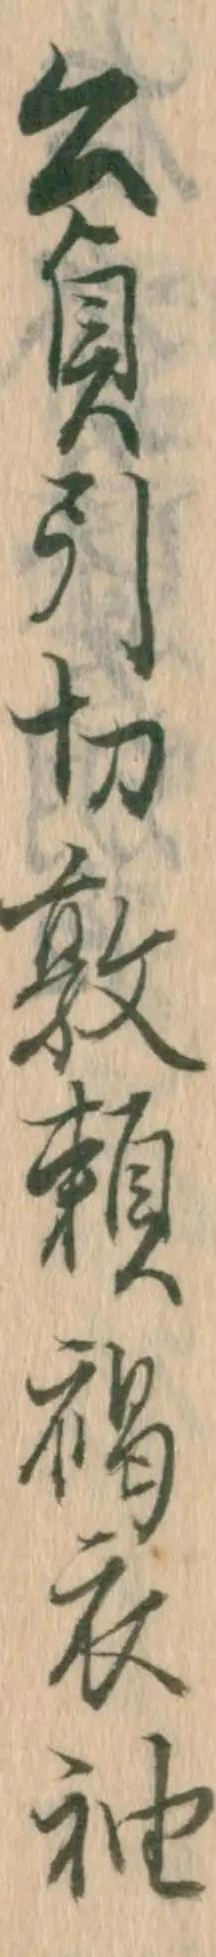公貞引切敦頼褐衣袖
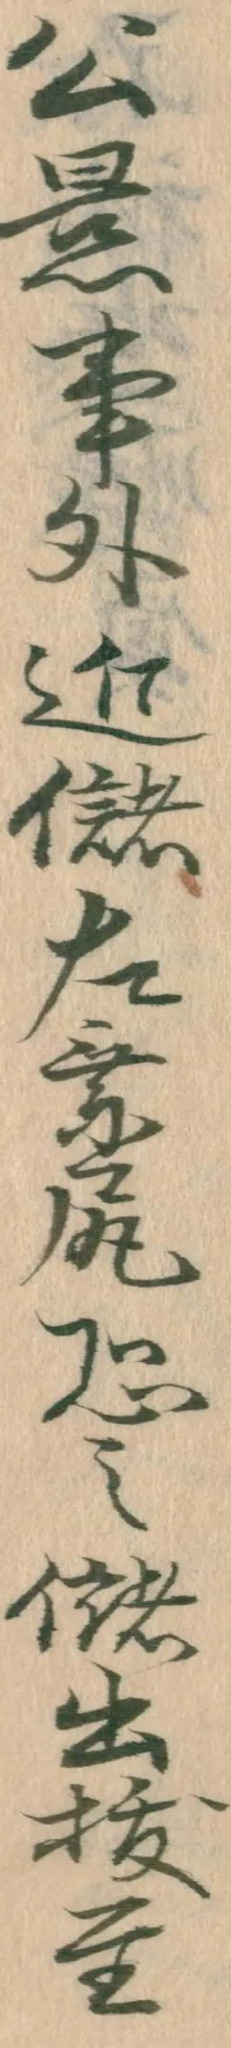公景事外近儲左乗尻恐之儲出抜置
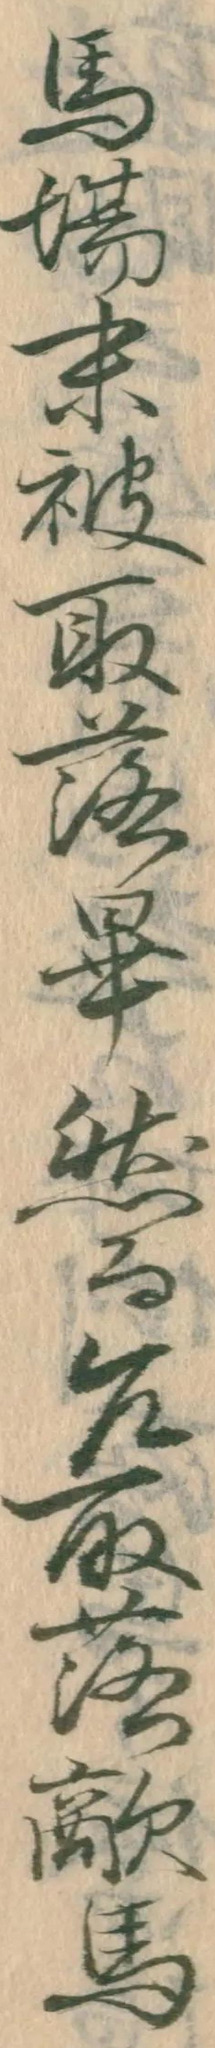馬場末被取落畢然て乍取落敵馬
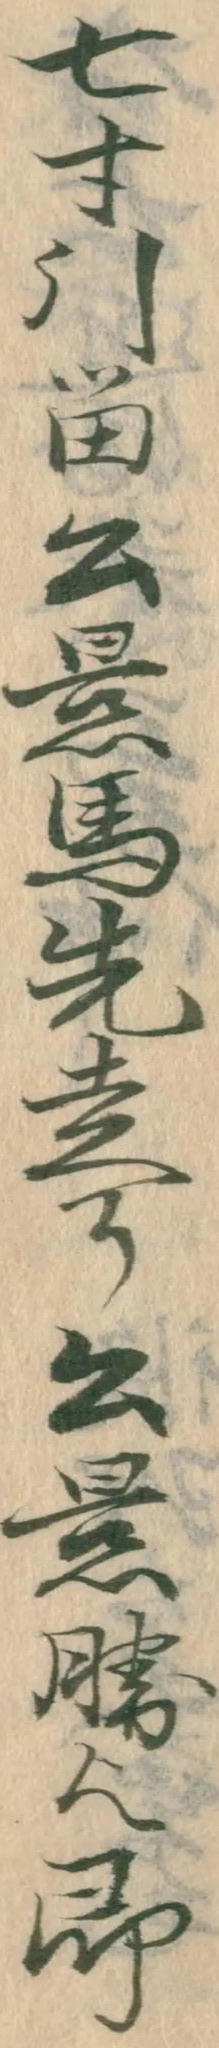七寸引留公景馬先走了公景勝歟即
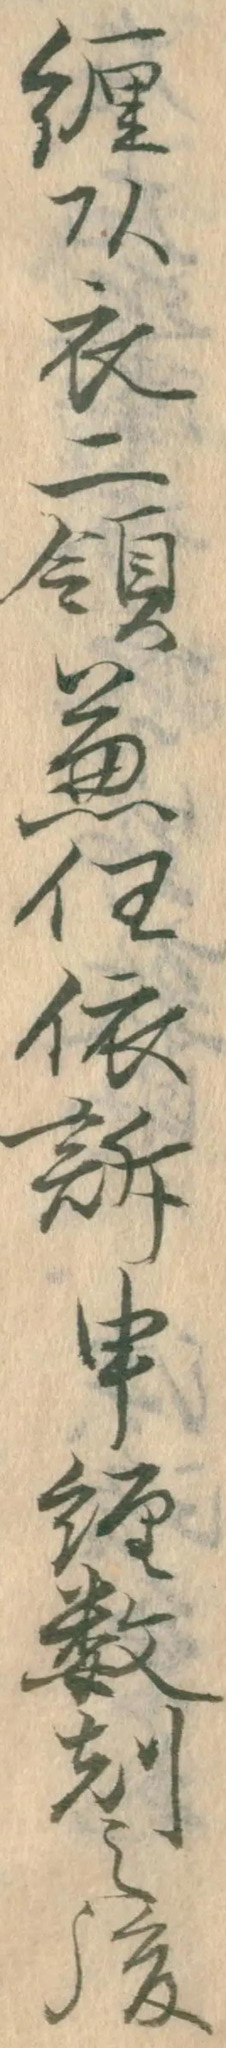纏頭衣二領兼任依訴申経数刻之後
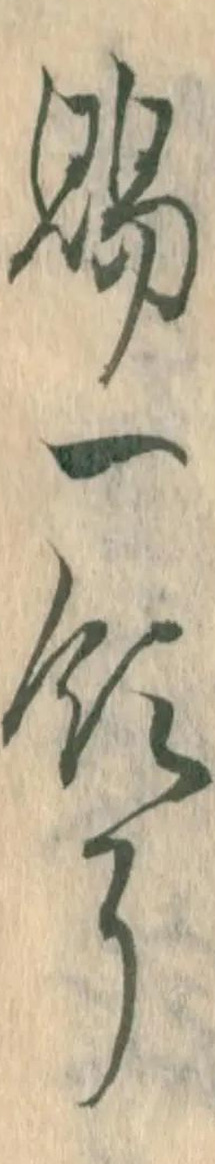賜一領了
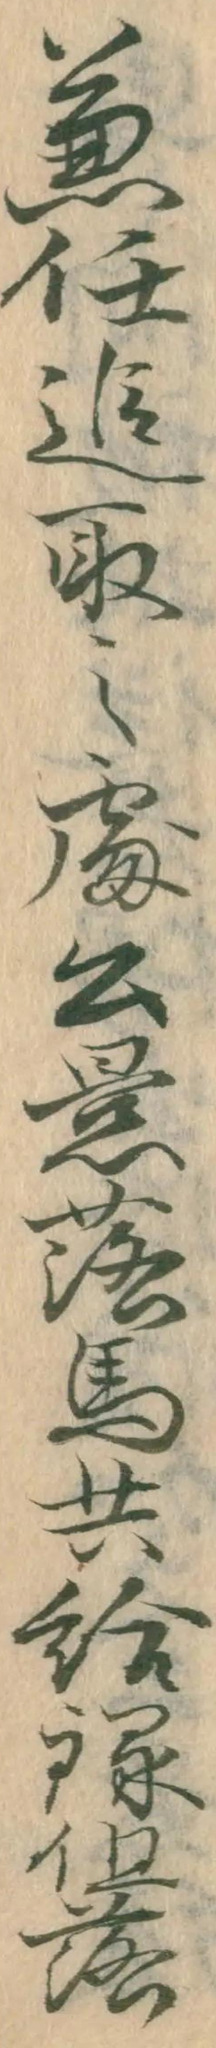兼任追取之処公景落馬共給録但落

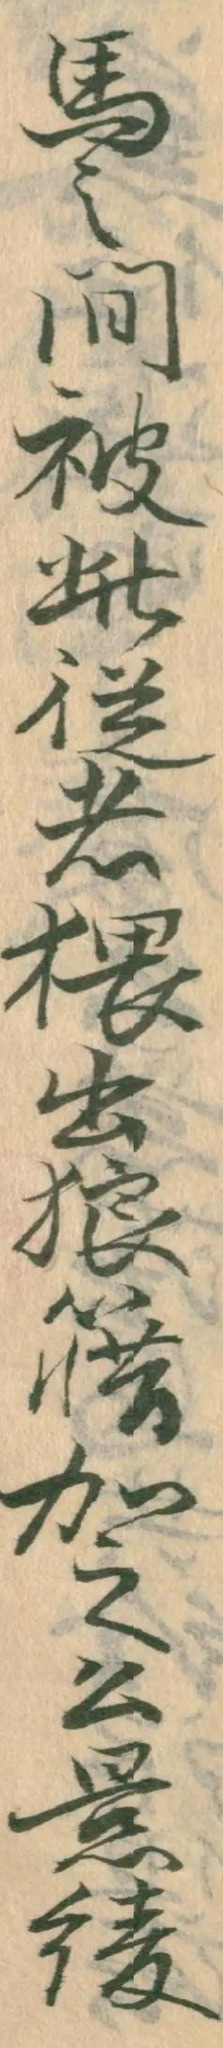馬之間被此従者猥出狼藉加之公景綾
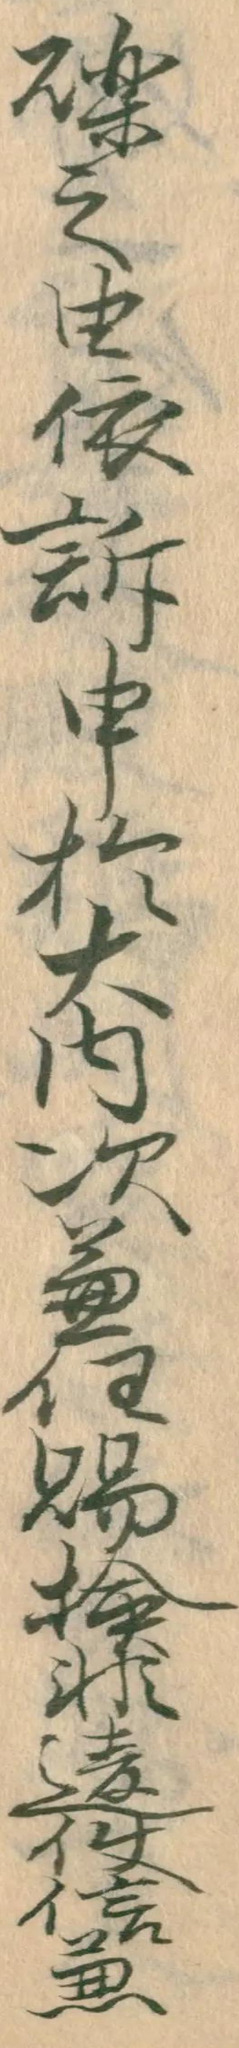礫之由依訴申於大内次兼任賜検非違使信兼
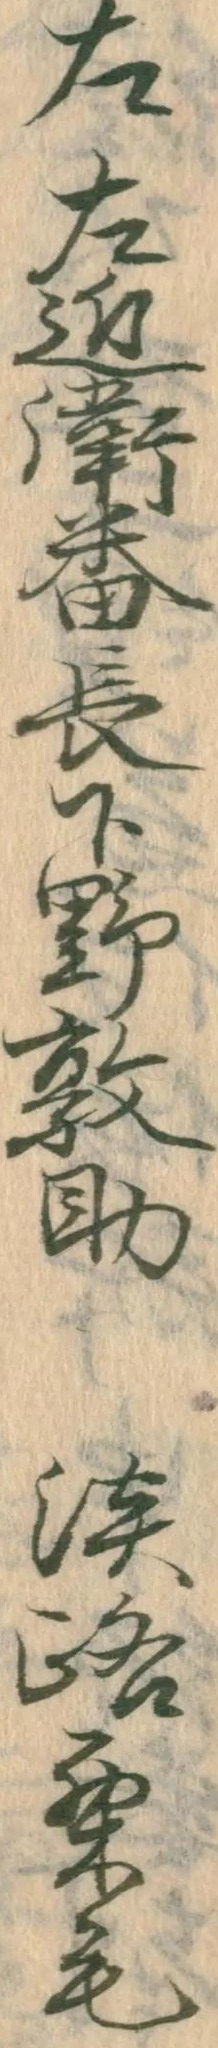左左近衛番長下野敦助淡路栗毛
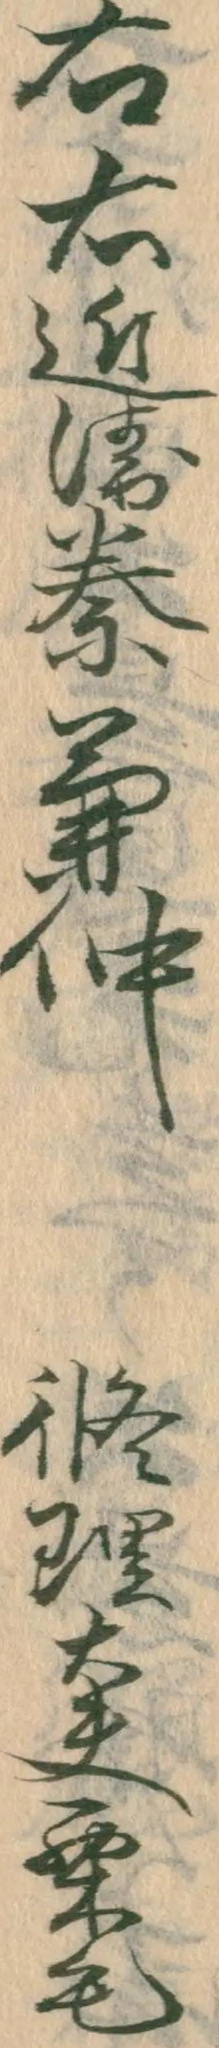右右近衛秦兼仲修理大夫栗毛
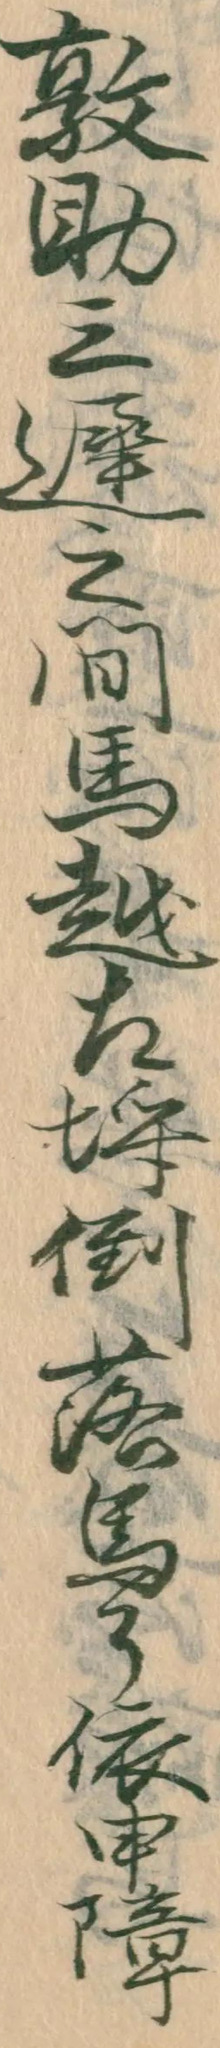敦助三遅之間馬越左埒倒落馬了依申障
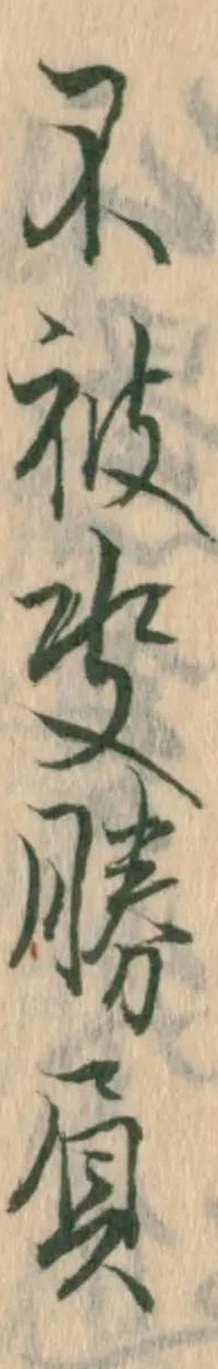不被決勝負
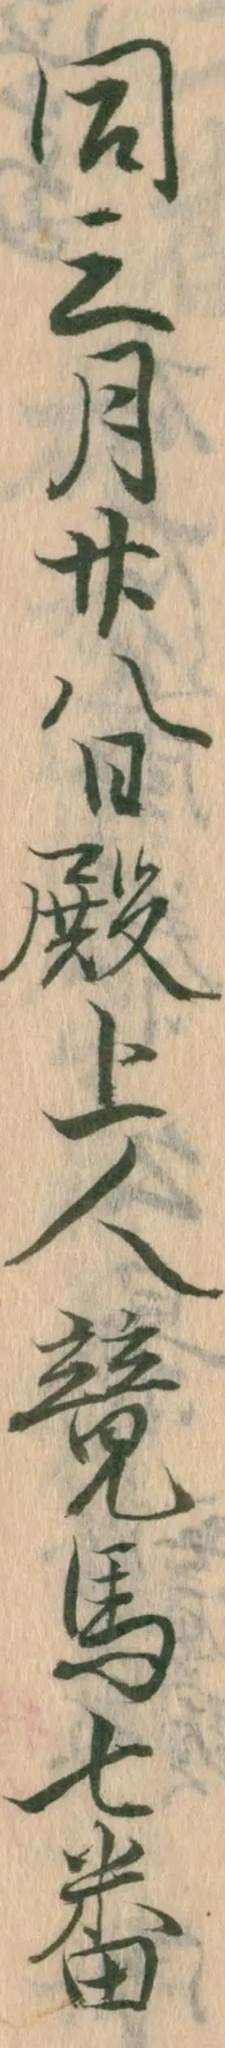同三月廿八日殿上人竟馬七番
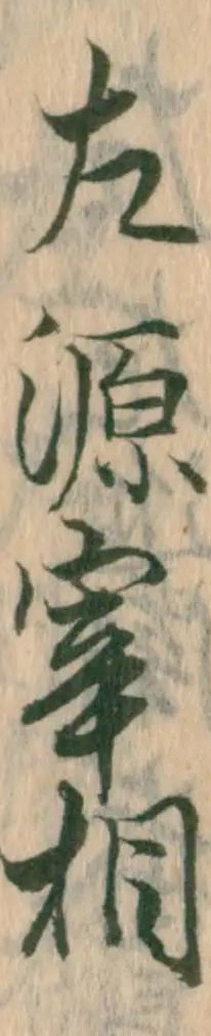左源宰相
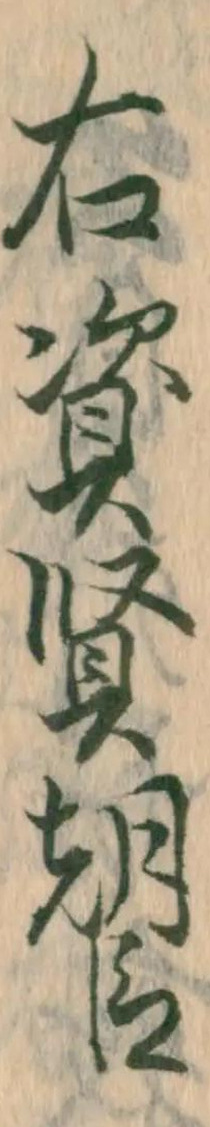右資賢朝臣
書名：賀茂社記録. 第13冊
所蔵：国立国会図書館 National Diet Library, JAPAN
